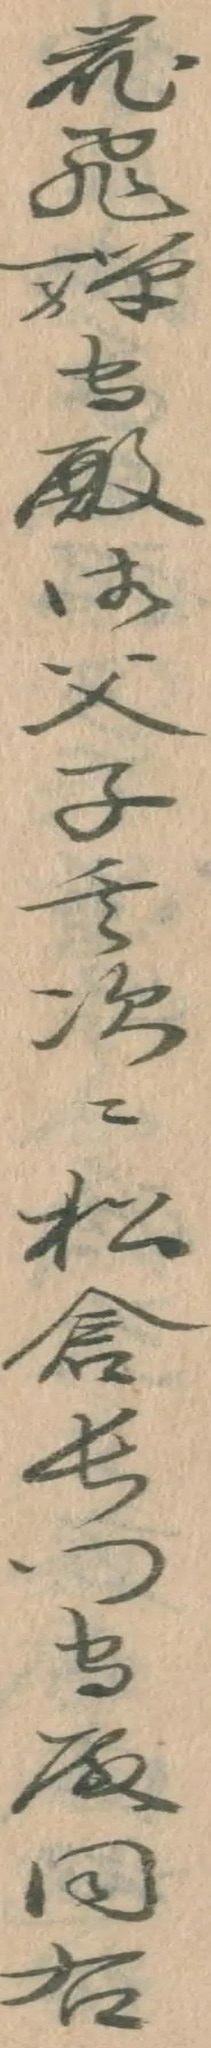花飛騨守殿御父子其次に松倉長門守殿同右
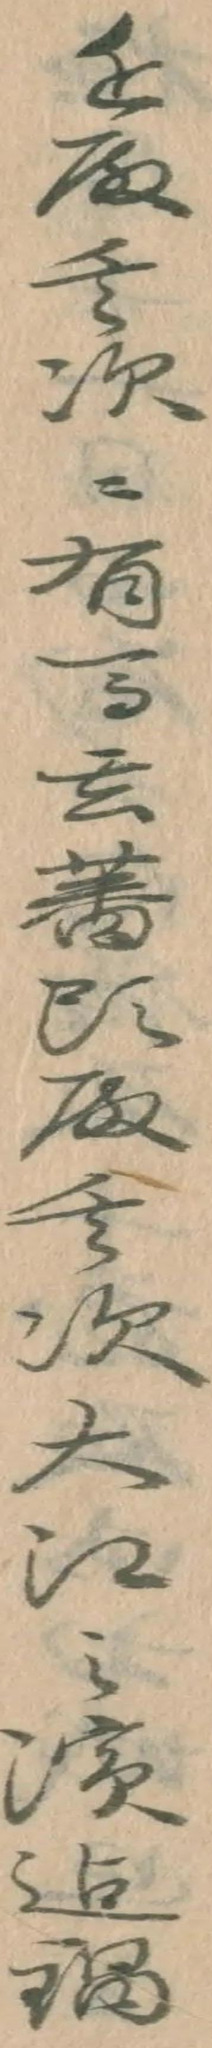近殿其次に有馬玄蕃頭殿其次大江之浜迄鍋
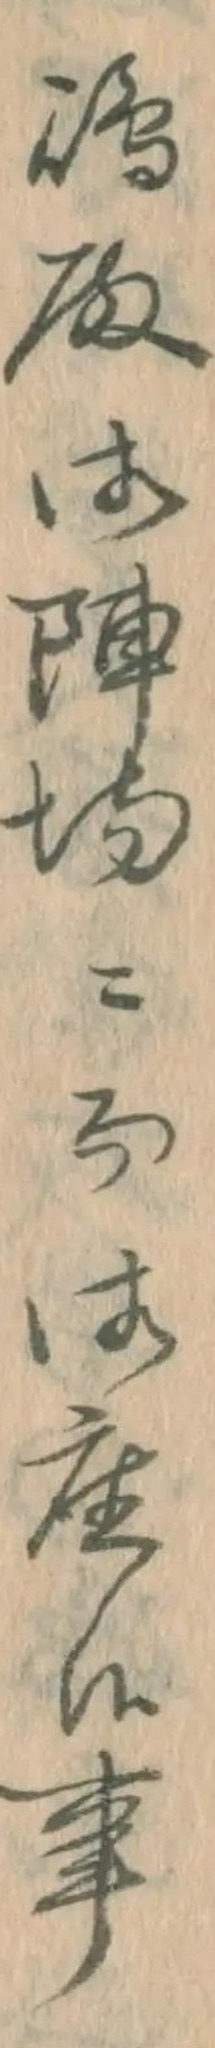島殿御陣場に而御座候事

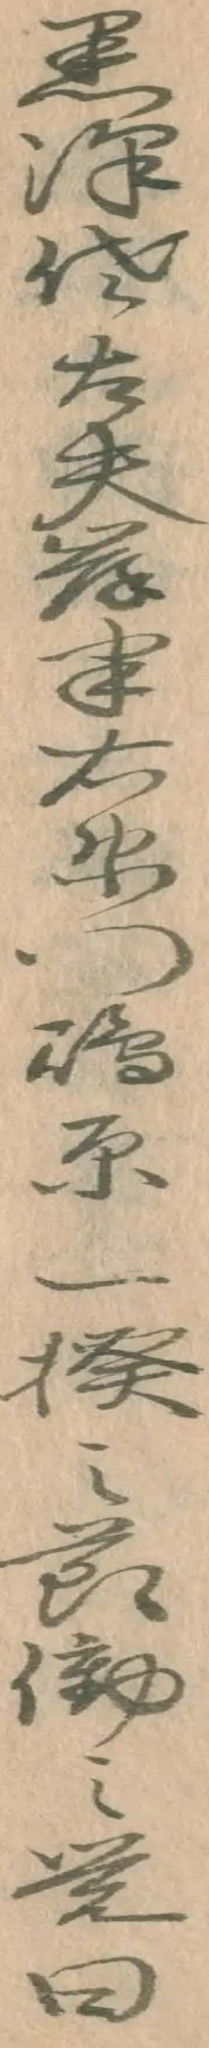黒沢佐太夫岸半右衛門島原一揆之節働之覚曰
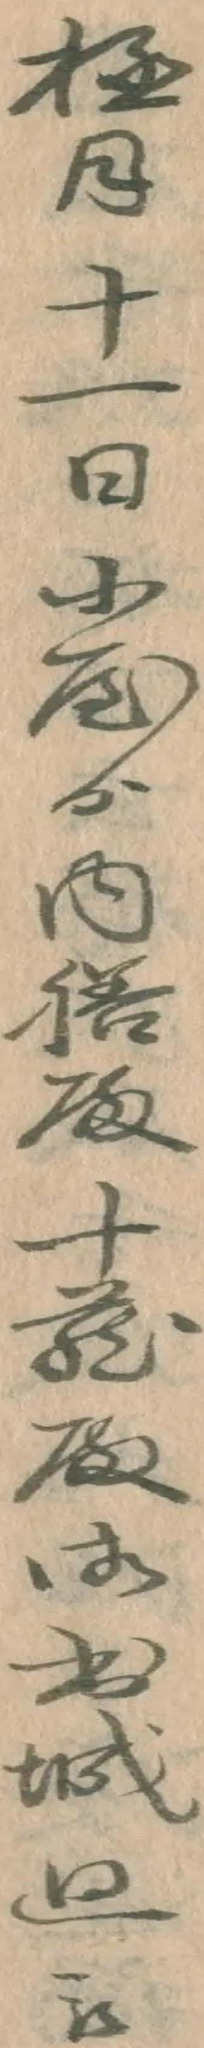極月十一日小屋ゟ内膳殿十蔵殿御出城廻被
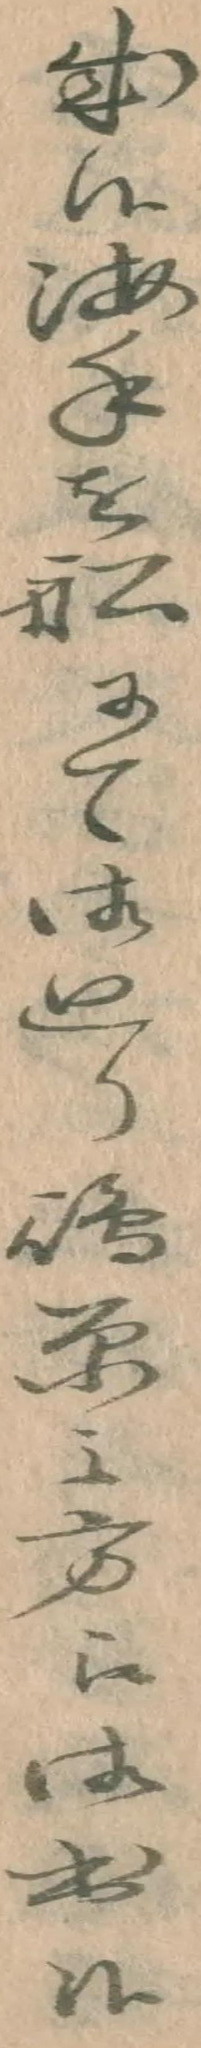成候海手を舩尓て御廻り島原之方江御出候
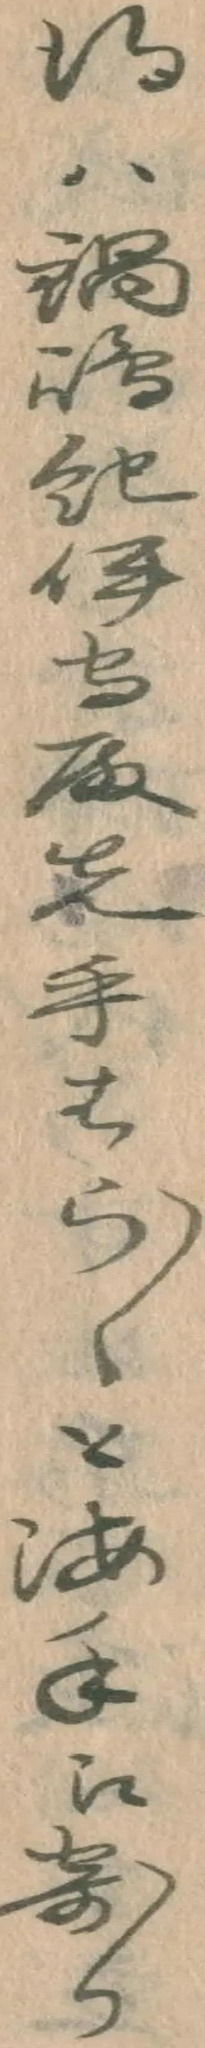得は鍋島紀伊守殿先手はら〱と海手江寄り
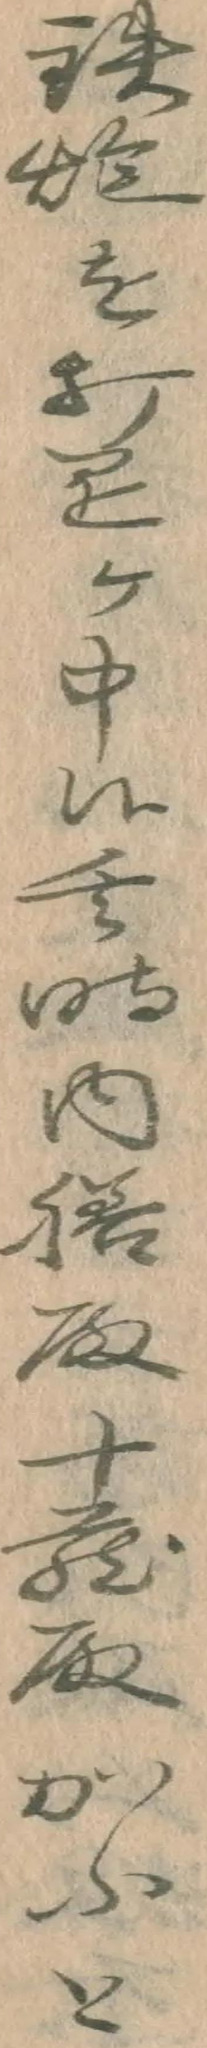鉄炮を打懸け申候其時内膳殿十蔵殿加ふと
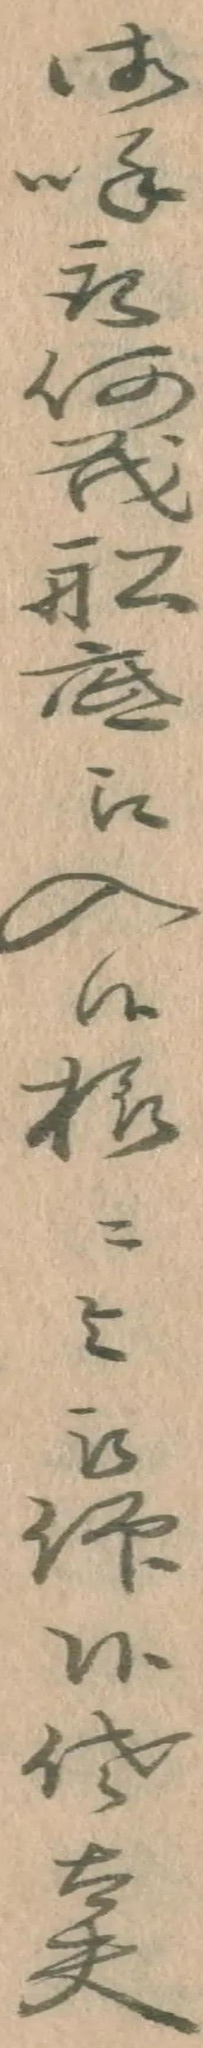御呼取何茂舩底江入候様に与被仰候佐太夫
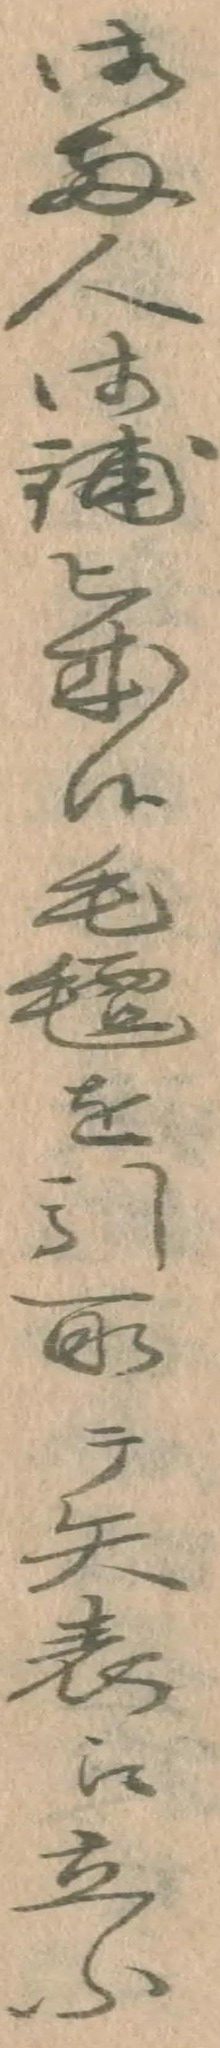御両人御鋪被成候毛氈を引取て矢表江立ふ
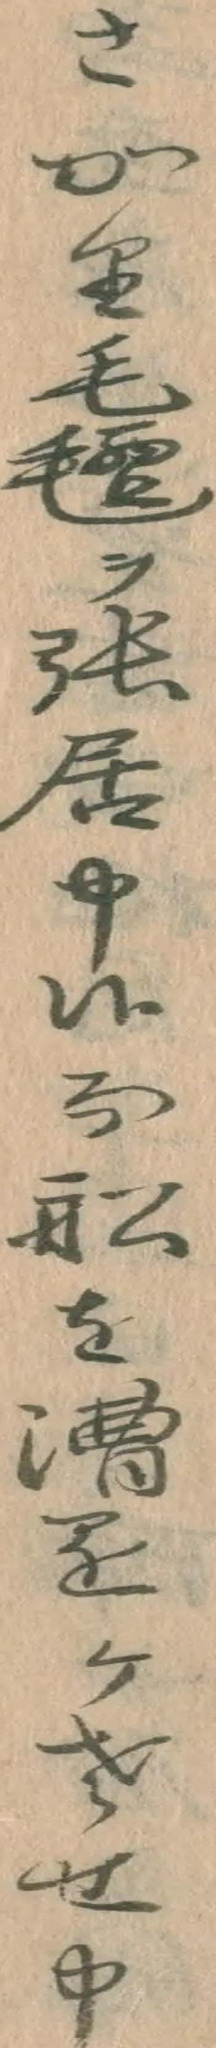さ加里毛氈を張居申候而舩を漕懸けさせ申
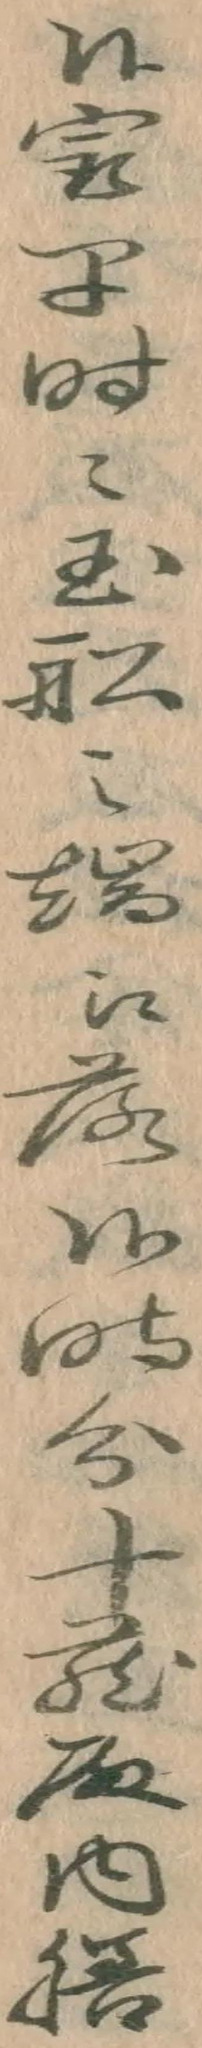候最早時々国舩之端江落候時分十蔵殿内膳
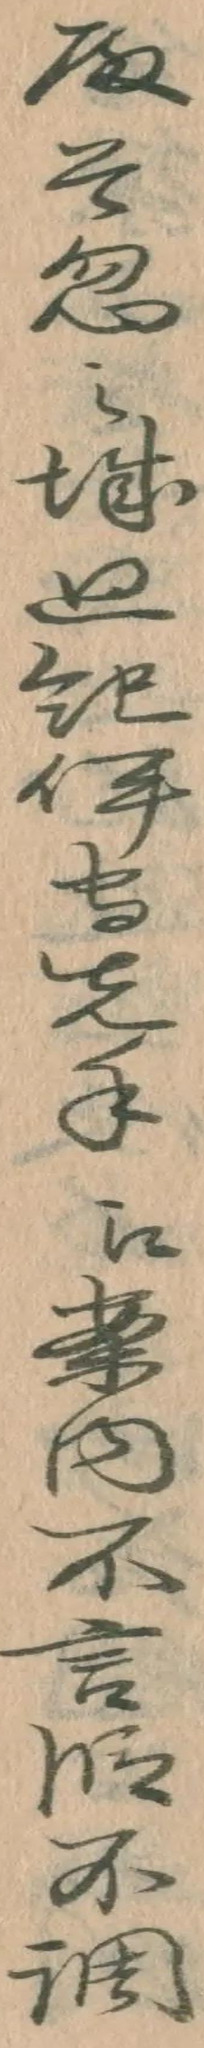殿そ忽之城廻紀伊守先手江案内不言段不調
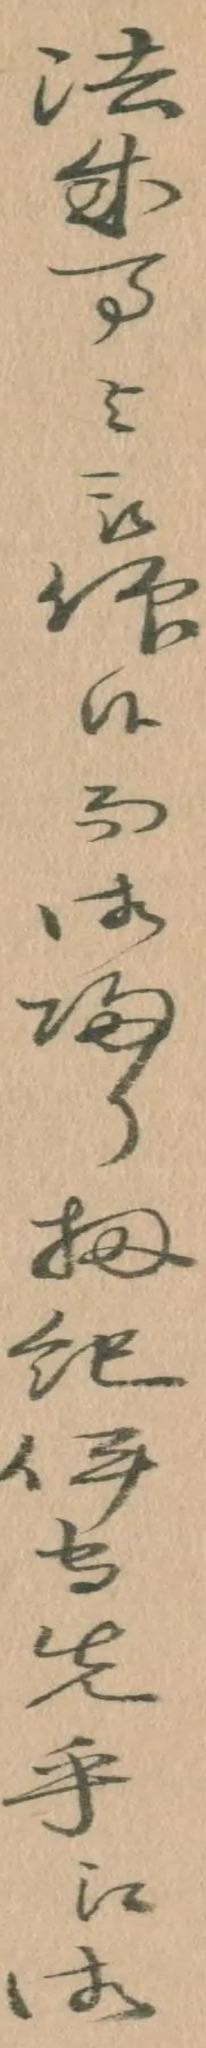法成事与被仰候而御帰り扨紀伊守先手江御
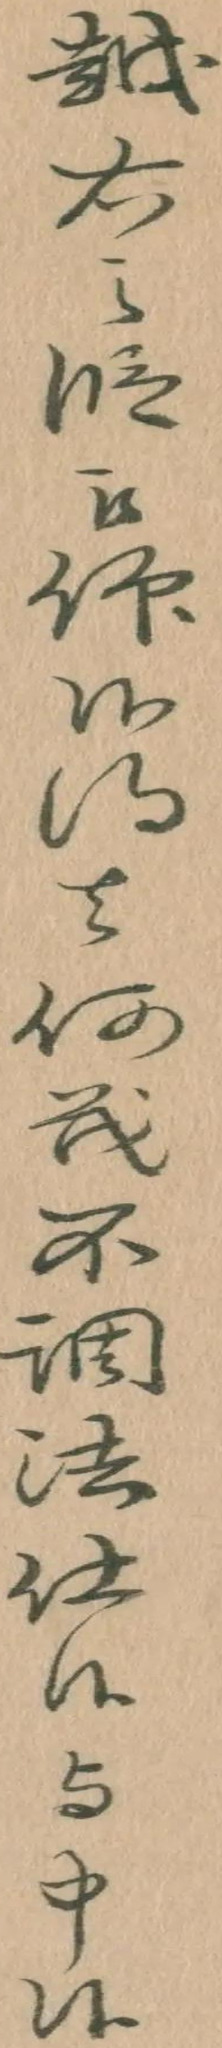越右之段被仰候得者何茂不調法仕候与申候
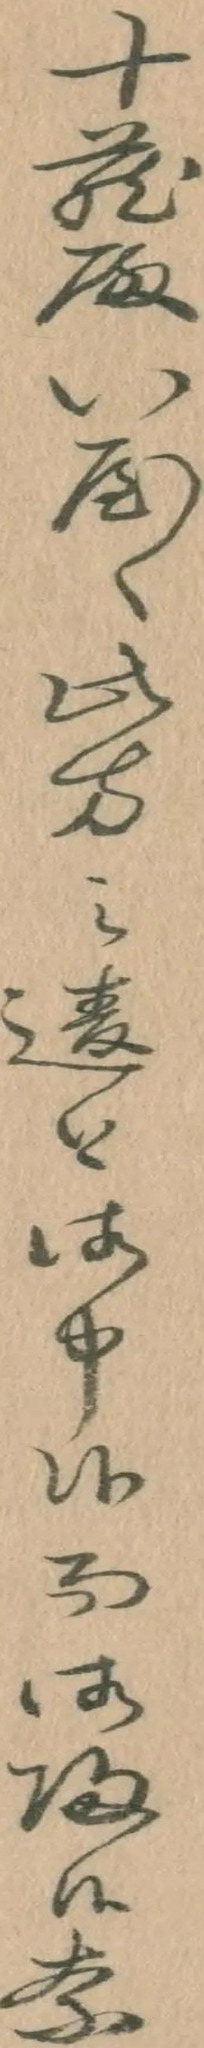十蔵殿い屋〱此方之違と御申候而御帰候奈
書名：切支丹御退治記 49巻. [4]
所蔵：国立国会図書館 National Diet Library, JAPAN
